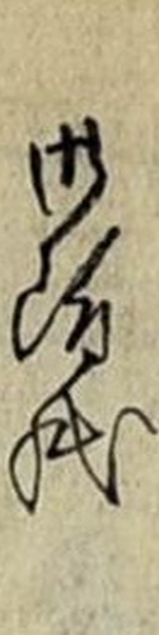御附紙
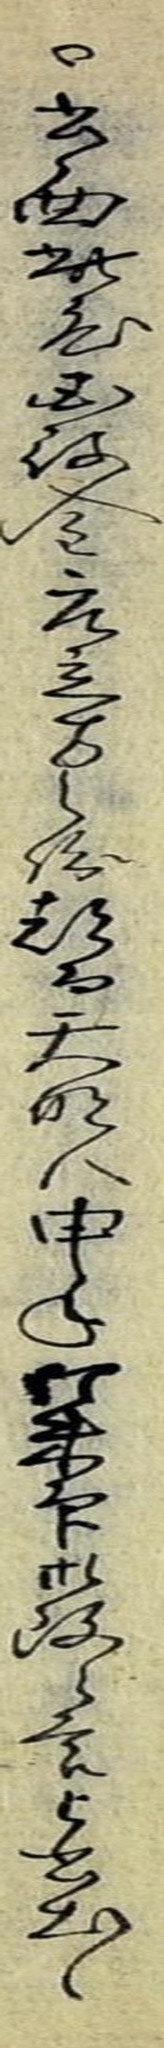○書面此度国役金取立方之儀都而天明八申年御朱印御改之節被書出候
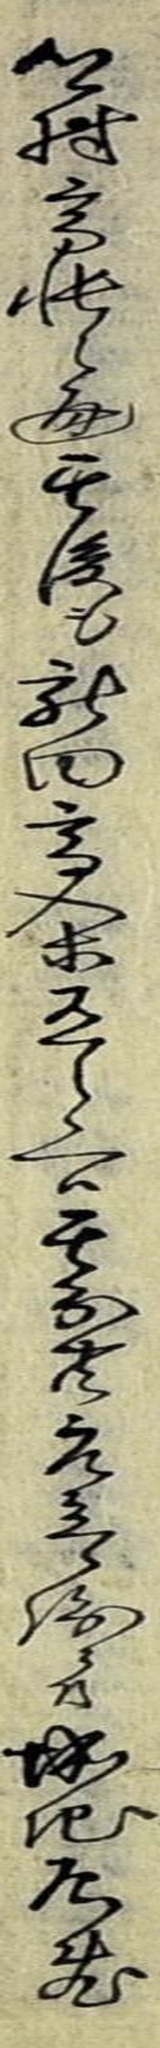郷村高帳之通其後も新田高等有之候へは其分共取立候儀に付城地屋敷
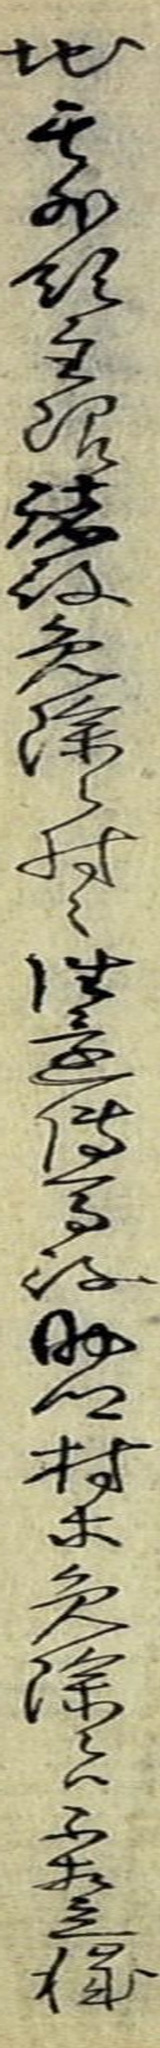地其外領主限諸役免除之村々往還伝馬役助郷村等免除には不相立禄
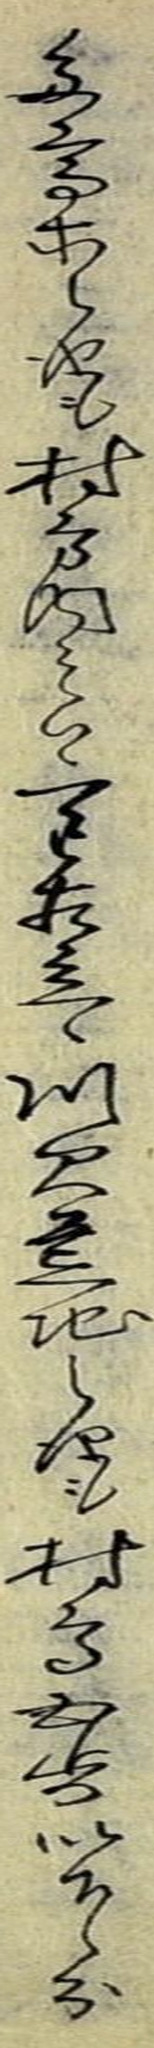多高等之儀も村方内に候はヽ可被相立候川欠荒地之儀も村高五歩以可之分
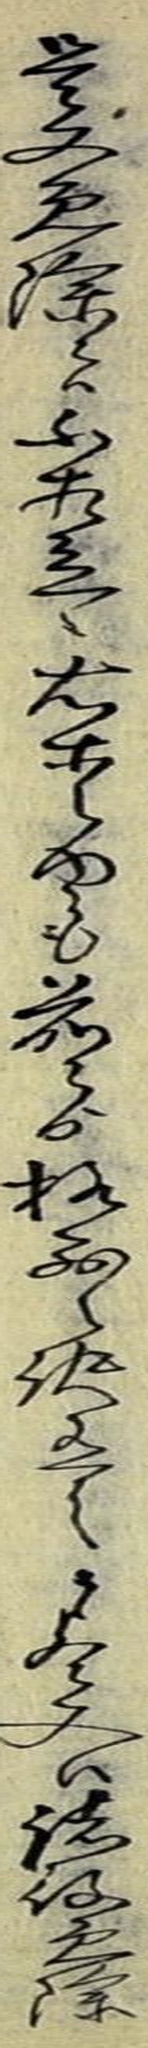是又免除には不相立候右等之内にも前々ゟ格別之訳有之候歟又は諸役免除
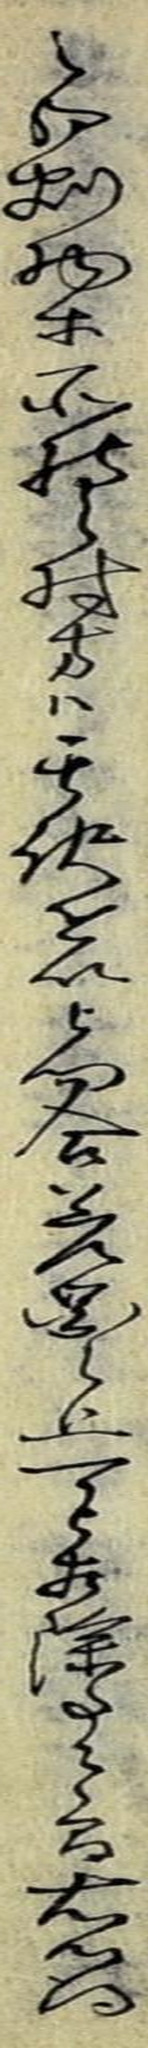之御判物等所持之村方ハ其訳を以被問合指図之上可被相除事に候間右心得
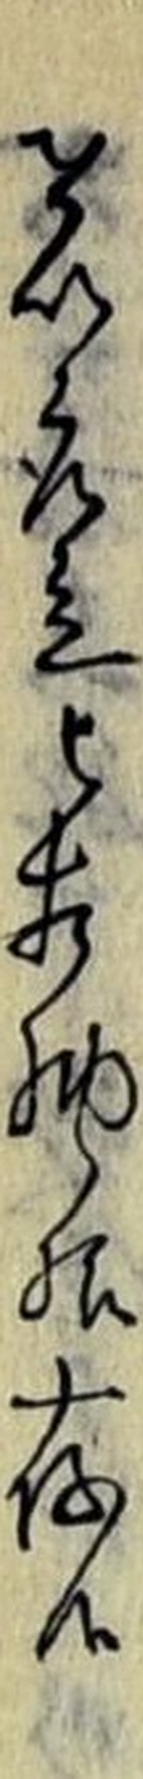を以取立被相納候様存候
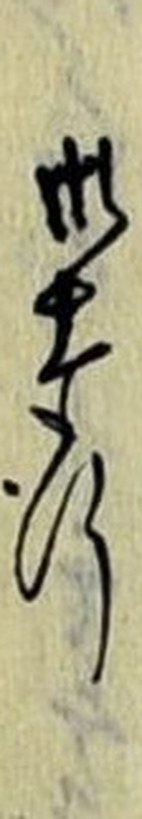御奉行
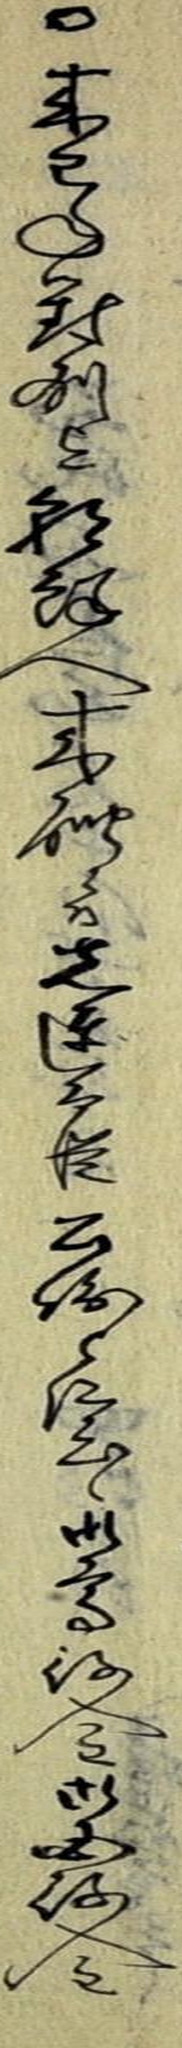○来巳年対州迄朝鮮人来聘に付先達而従公儀被仰出候御高役金御国役金
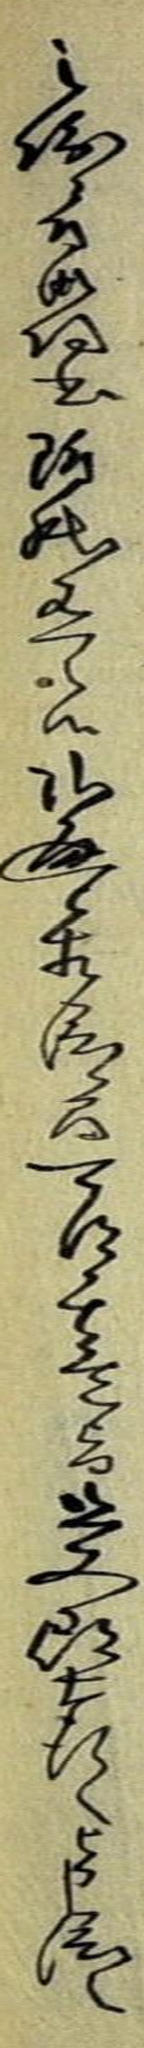之儀に付御伺書附紙有之候弐通相渡候間可得其意旨且又郡奉行へ被申渡之
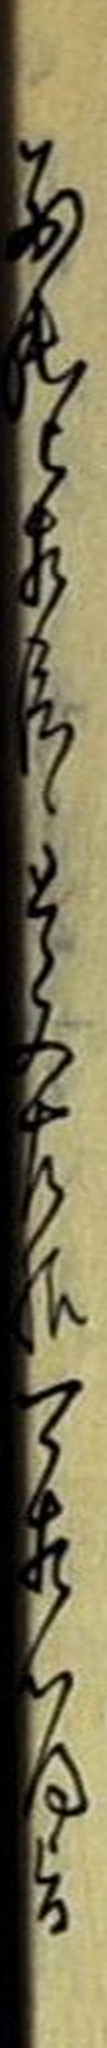別紙被相渡候且又左様可相心得旨
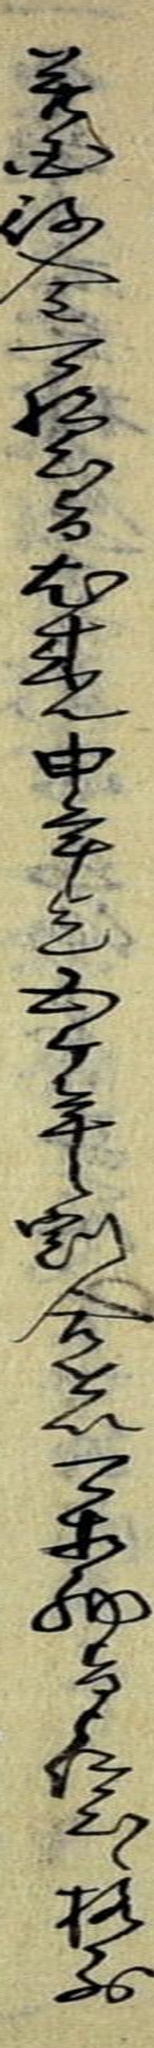并国役金可指出旨尤来ル申年迄五ヶ年割を以可相納旨被仰出候格別
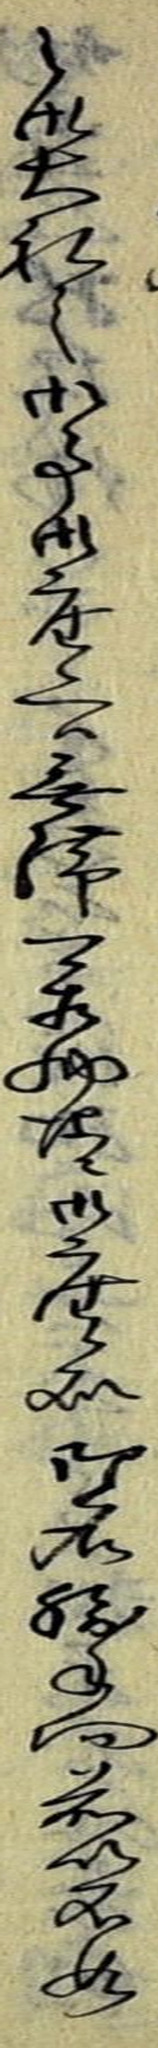之御大礼之御事御座候へは無滞可相勤儀に御座候処御名勝手向前以不如
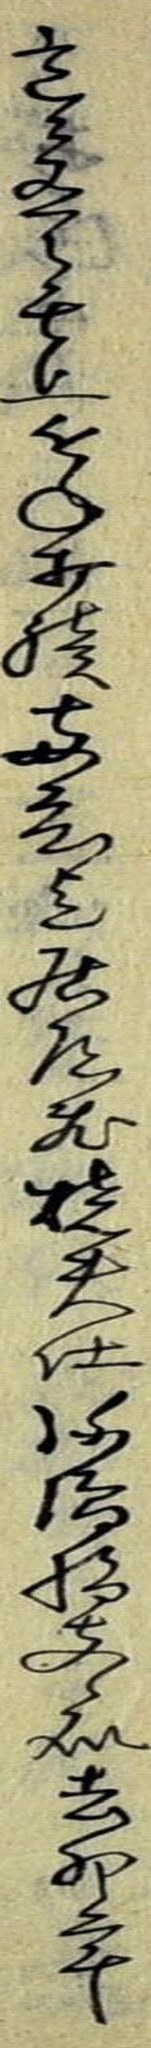意に有之其上近年打続両度迄居屋敷焼失仕弥増指支候処去卯年
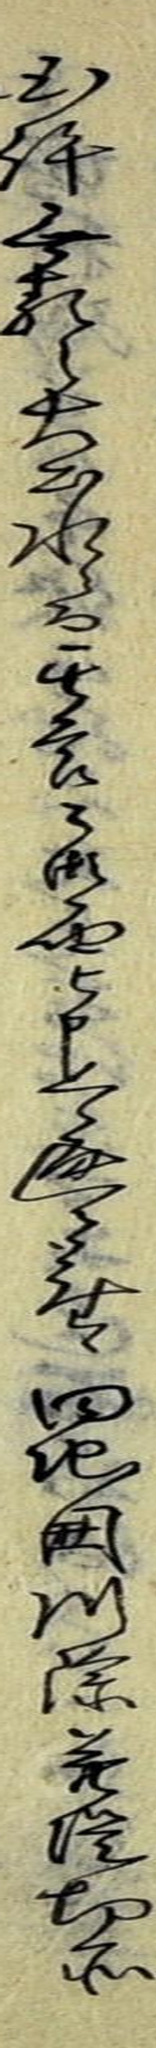国許無類之大出水に而其節々御届被申上候通に御座候田地囲川除并堤切所
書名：命令之部 四
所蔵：福井県文書館 Fukui Prefectural Archives
